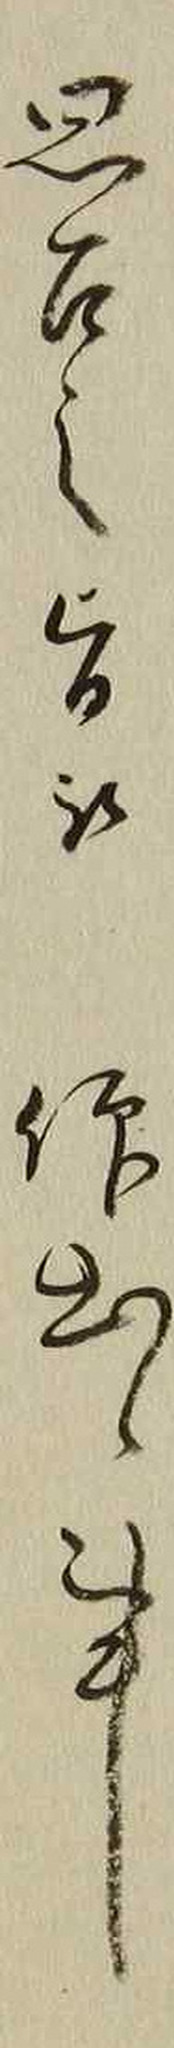思召之旨被仰出候事
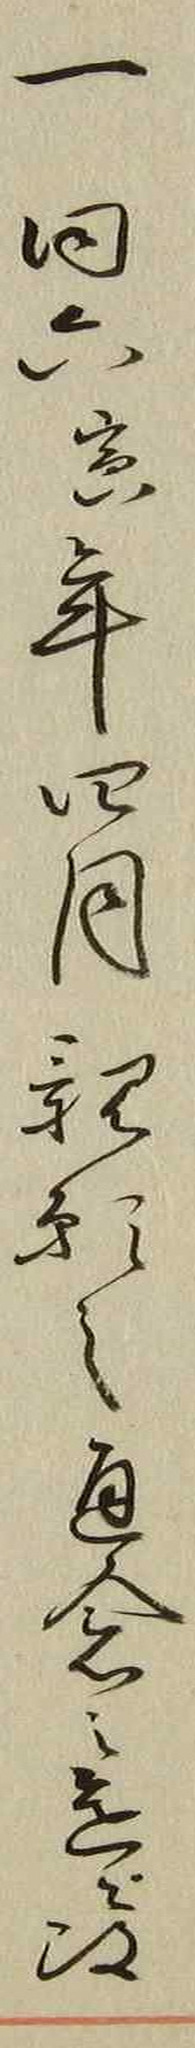一同六寅年四月親願之通倉之進と改
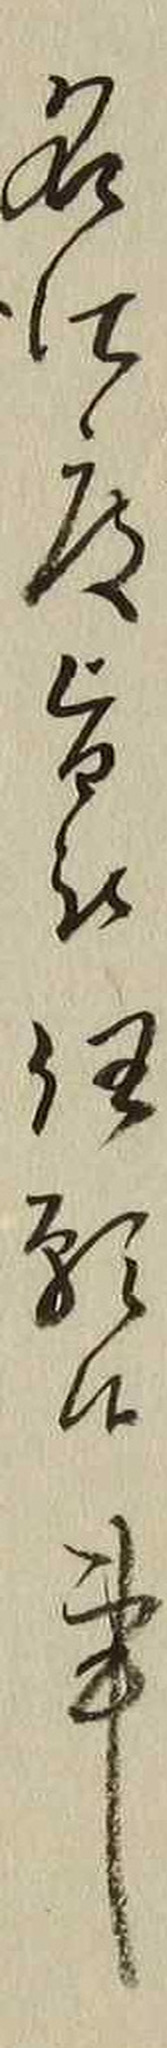名仕度旨被任願候事
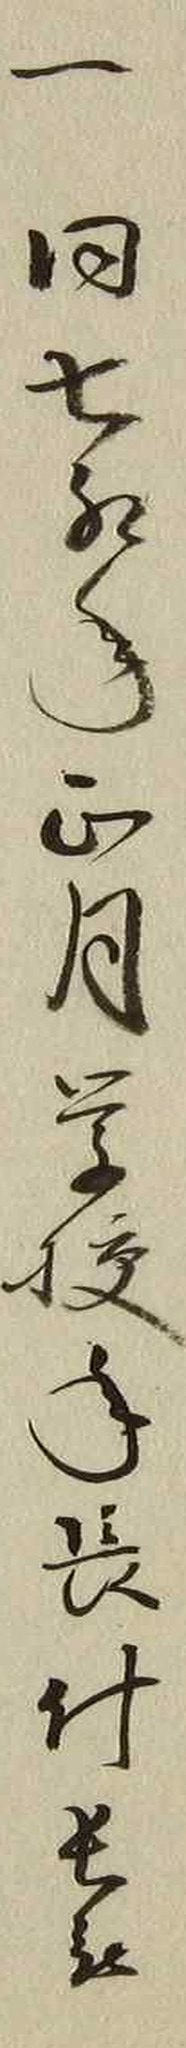一同七卯年正月学校年長什長被
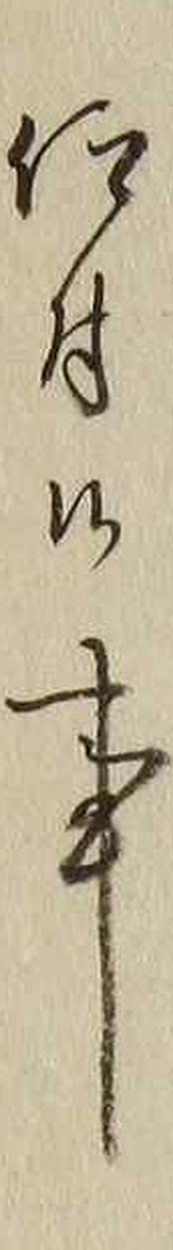仰付候事
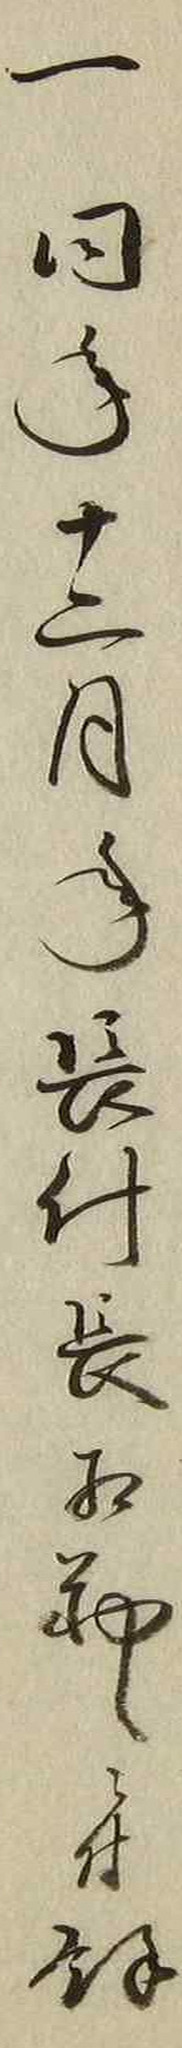一同年十二月年長什長相勤候に付余
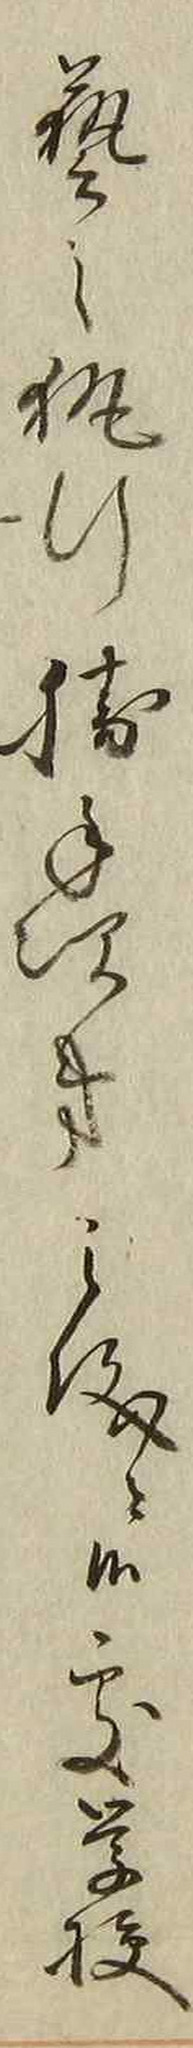芸之執行勝手次第之儀に候処学校
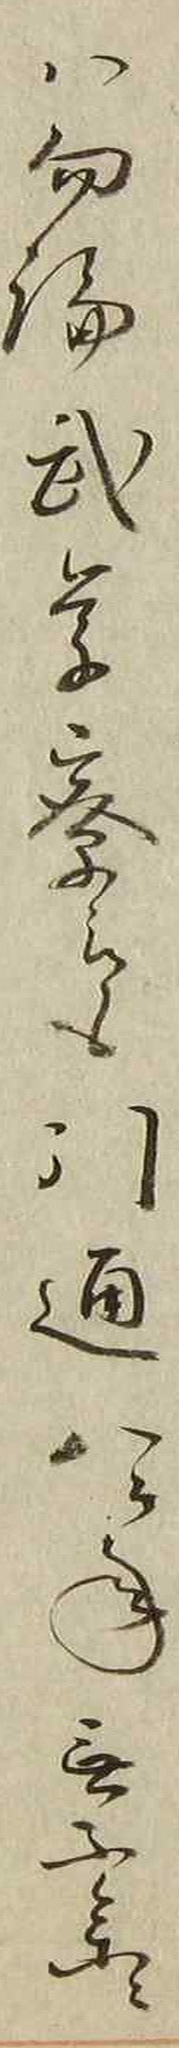ハ勿論武学寮江も引通八ヶ年無不参に
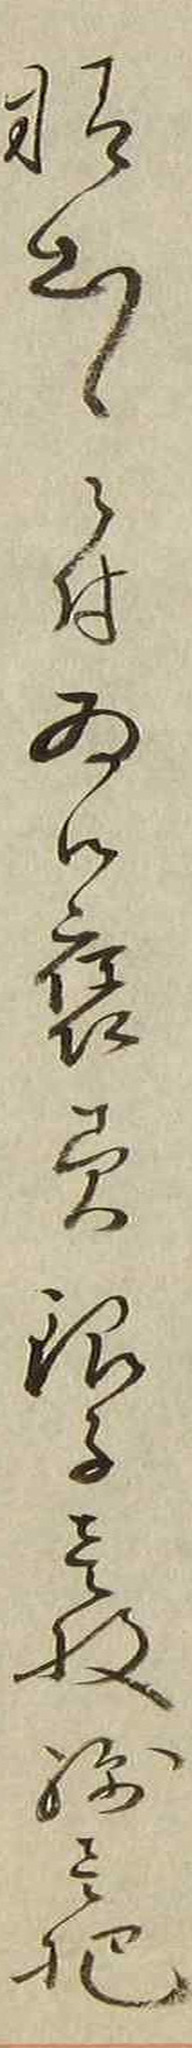精出候に付為御褒美銀子壱枚綿壱把
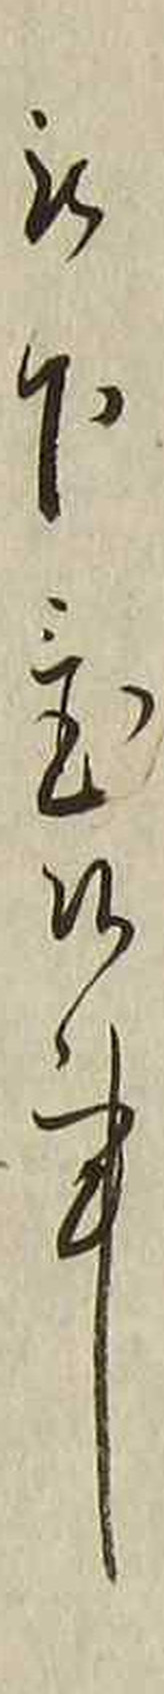被下置候事
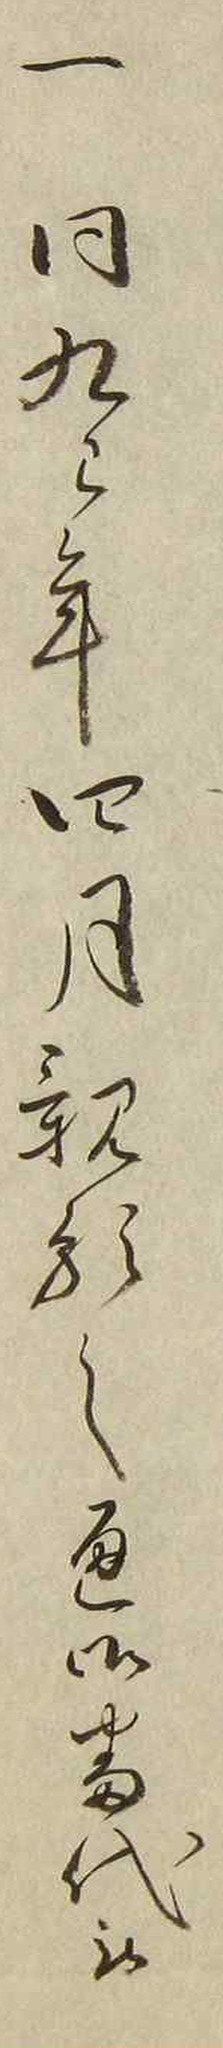一同九巳年四月親願之通御番代被

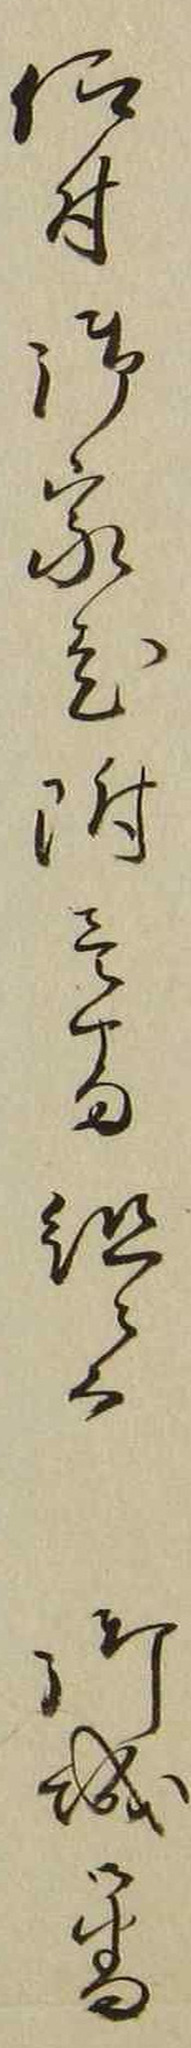仰付御家老附壱番組に而御城御番
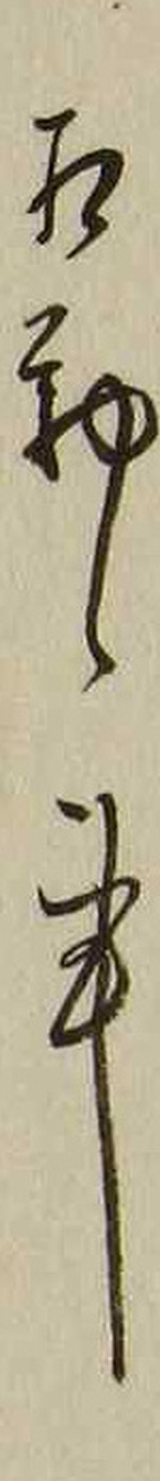相勤候事
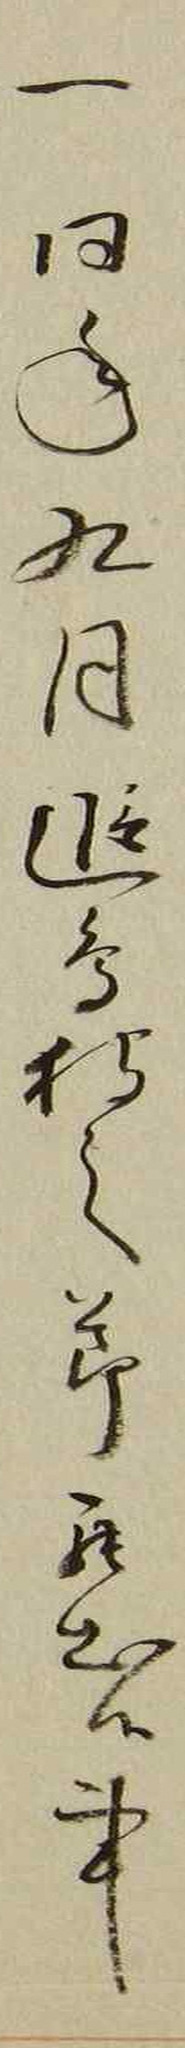一同年九月追鳥狩之節罷出候事
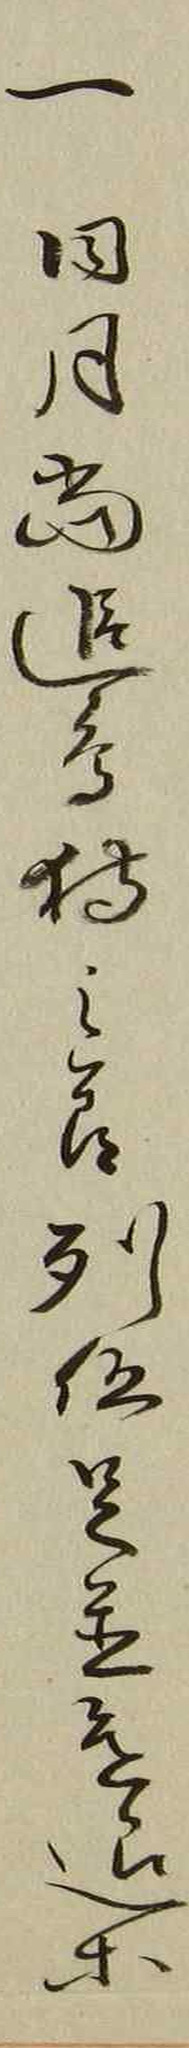一同月当追鳥狩之節列伍足並進退等
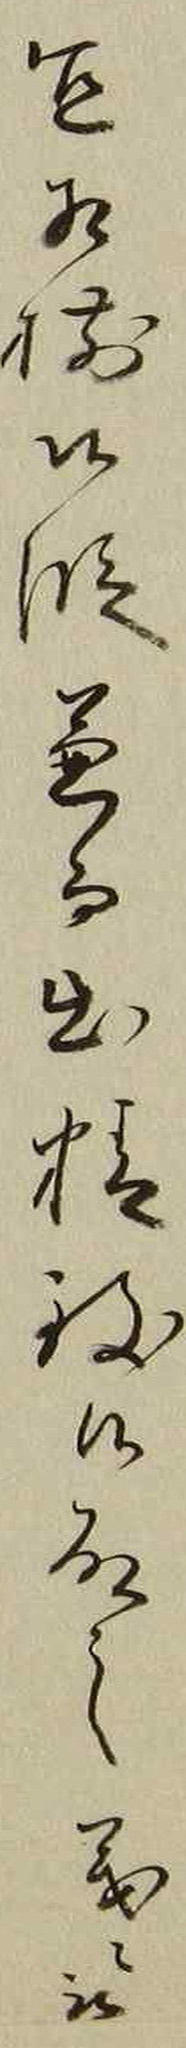宜相揃候段兼而出精致候故之義に被
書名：諸士系譜　巻之3　い之部3
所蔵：会津若松市立会津図書館
